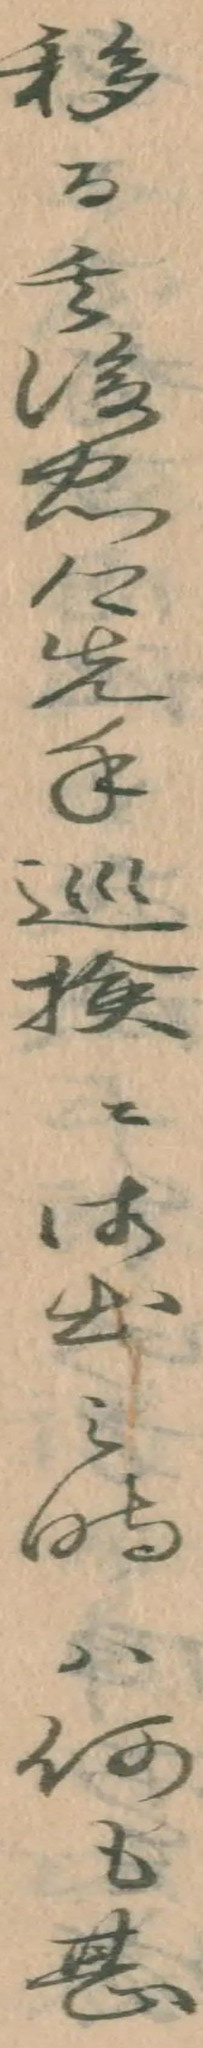移る其後忠郷先手巡検に御出之時は何も甚
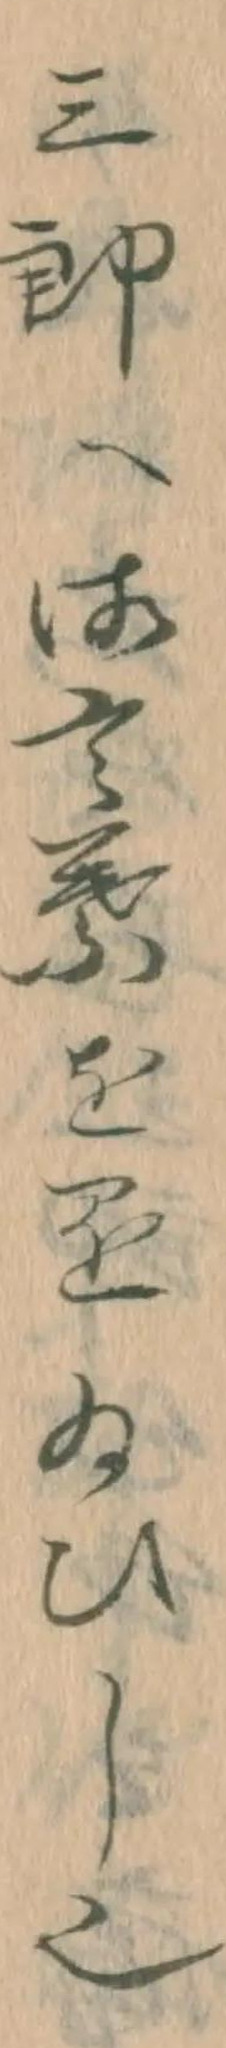三郎へ御言葉を懸ゐひし也
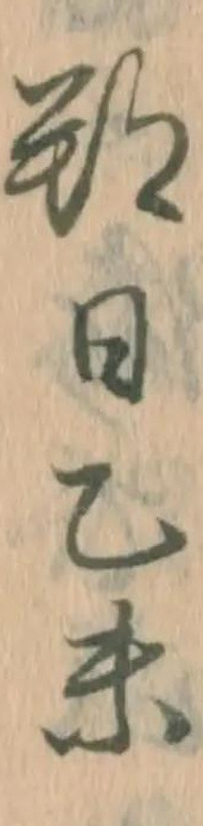朔日乙未
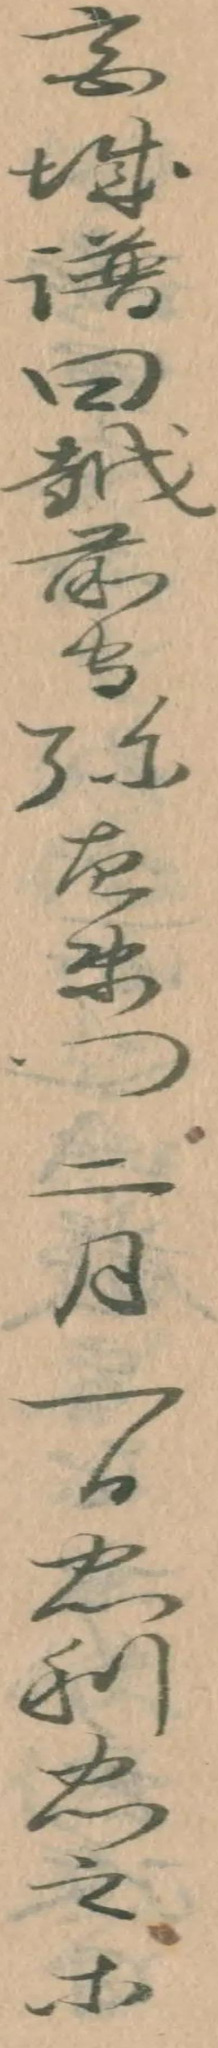宮城譜曰越前守弥左衛門二月一日忠利忠郷等
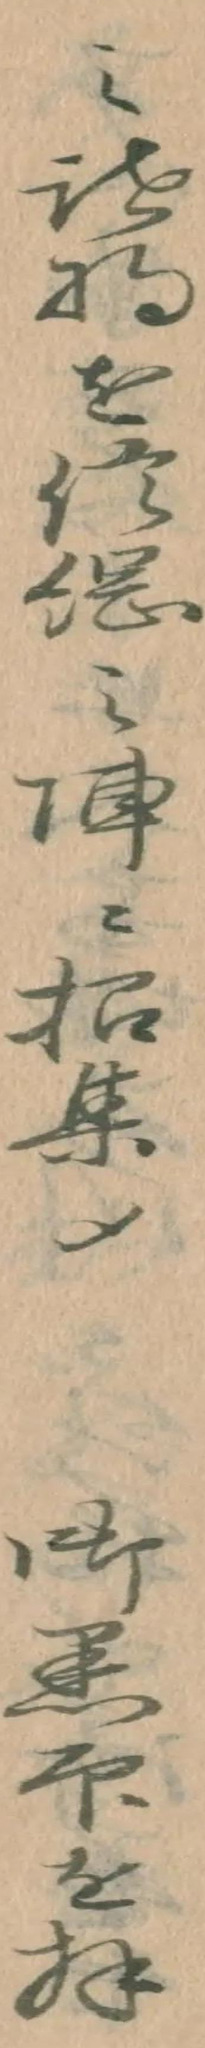之諸将を信濃之陣に招集め御黒印を拝
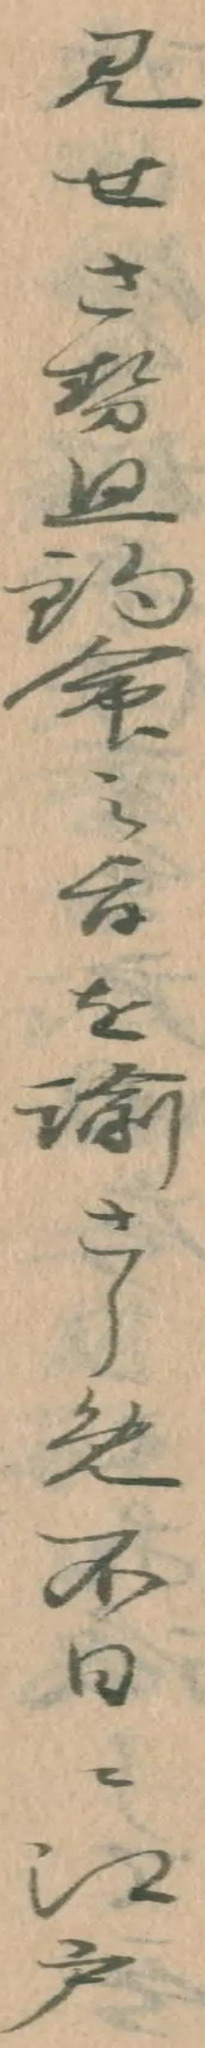見せさ勢且釣命之旨を諭さし免不日に江戸
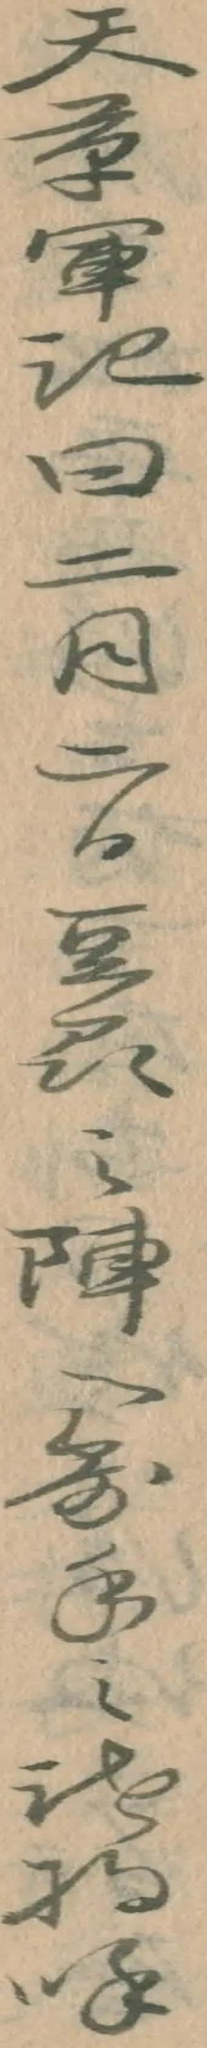天草軍記曰二月二日豆州之陣へ寄手之諸将呼
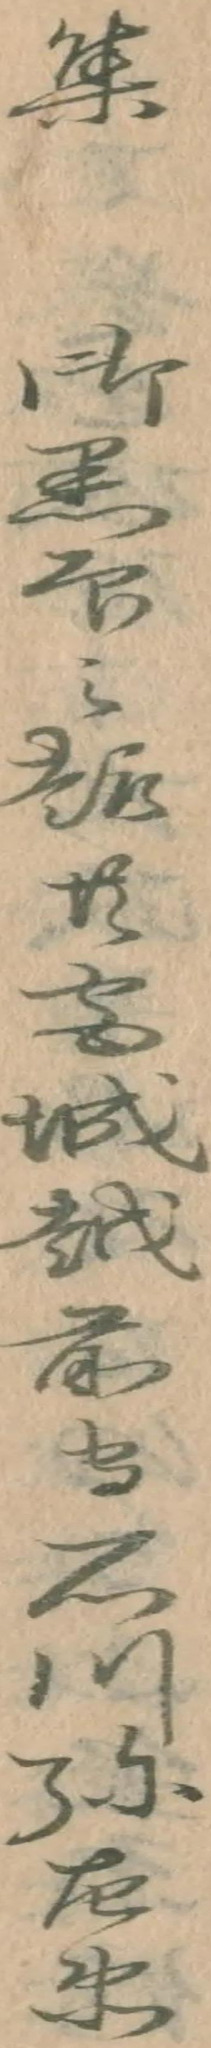集御黒印之趣共宮城越前守石川弥左衛
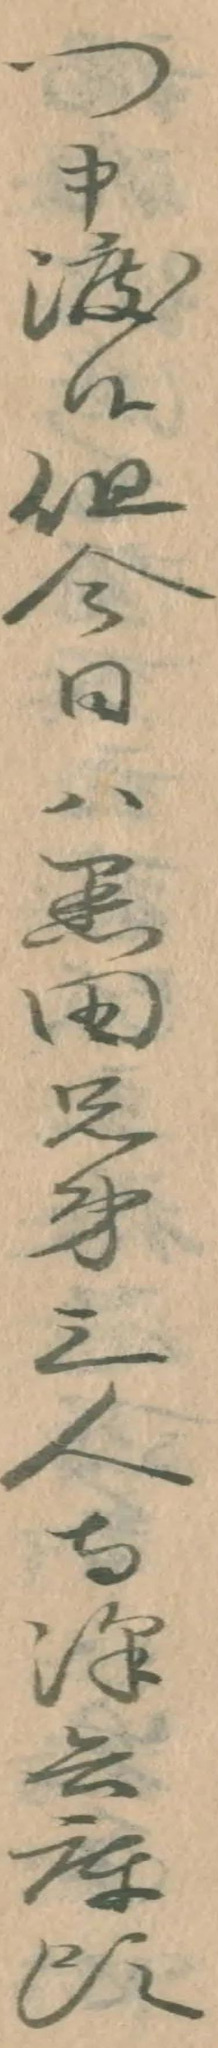門申渡候但今日は黒田兄弟三人寺沢兵庫頭
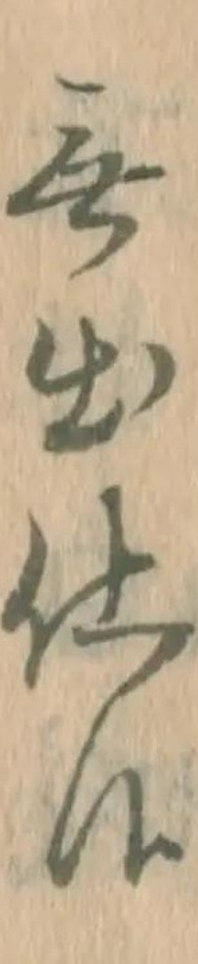無出仕候
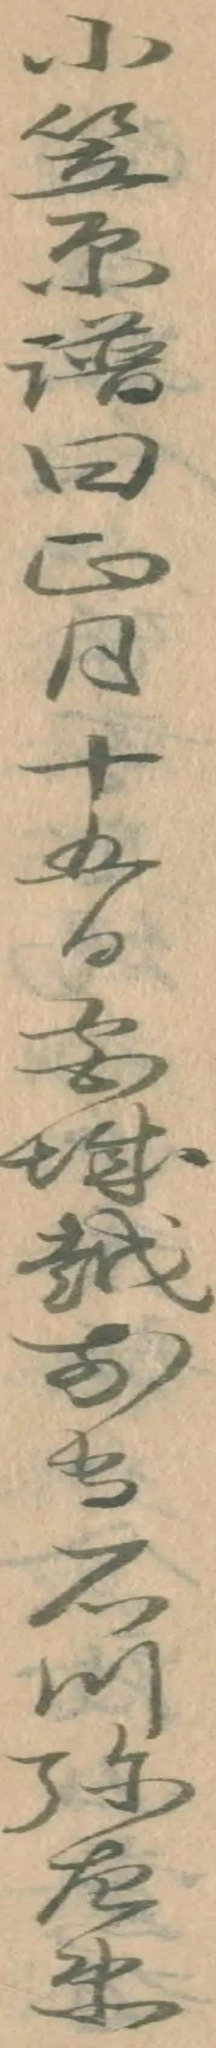小笠原譜曰正月十五日宮城越前守石川弥左衛
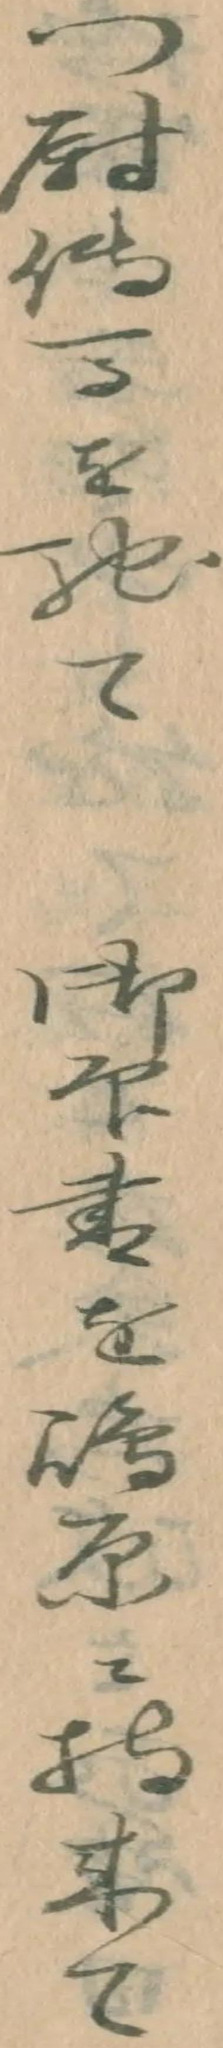門尉傳馬を馳て御印書を島原に持来て

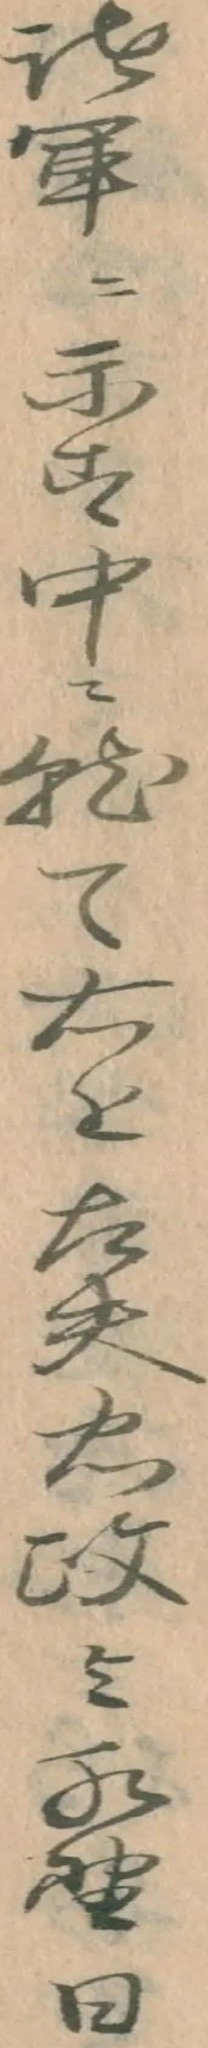諸軍に示春中に就て右近太夫忠政与水野日
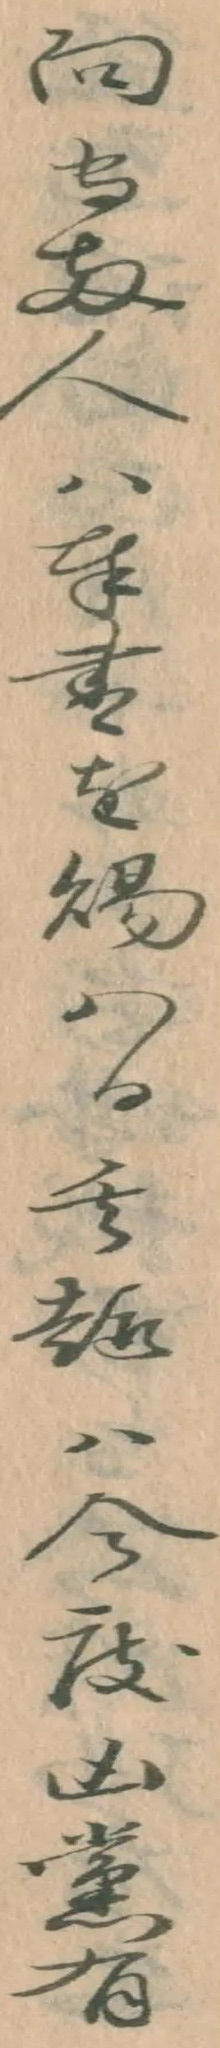向守両人は奉書を賜はる其趣は今度凶党有
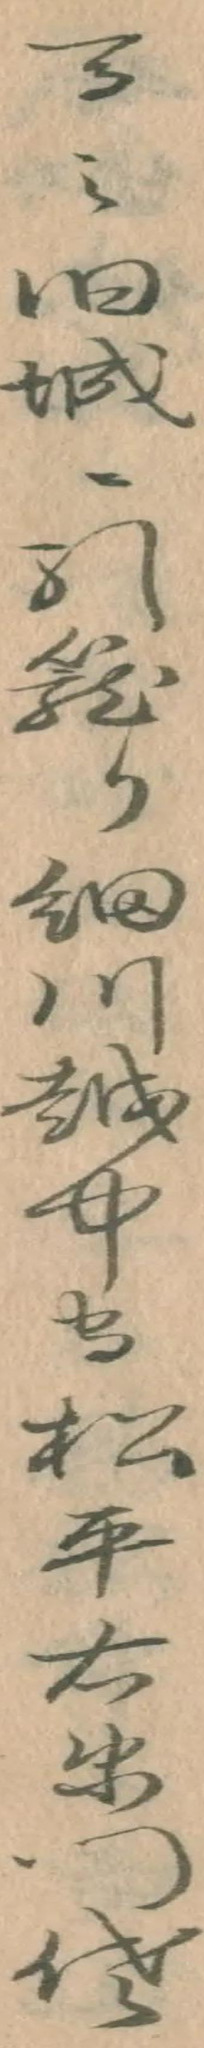馬之旧城に引籠り細川越中守松平右衛門佐
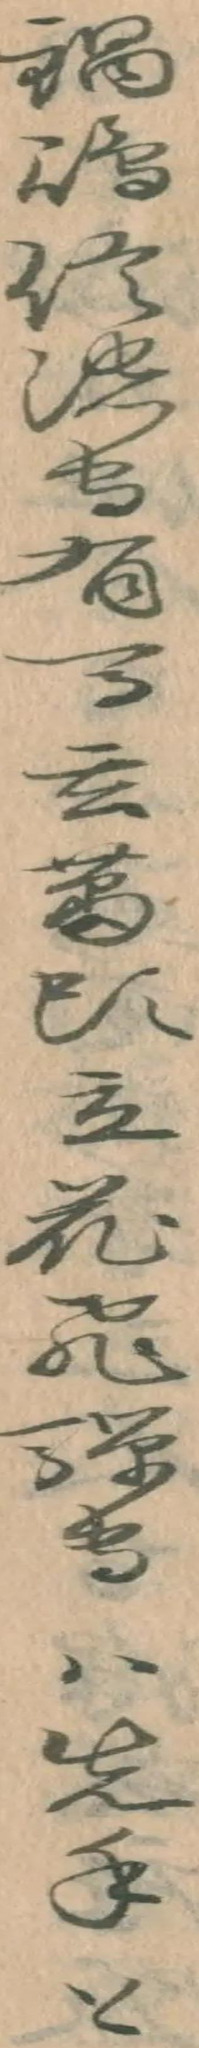鍋島信濃守有馬玄蕃頭立花飛騨守は先手と
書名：切支丹御退治記 49巻. [6]
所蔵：国立国会図書館 National Diet Library, JAPAN
